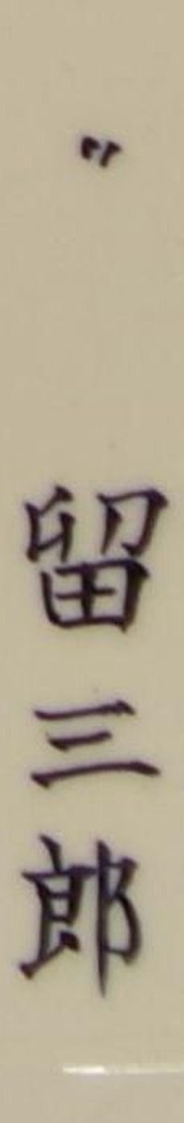留三郎
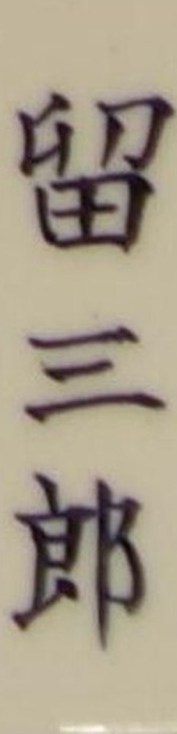留三郎
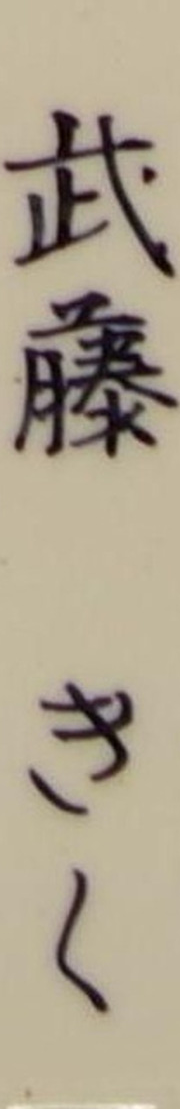武藤きく
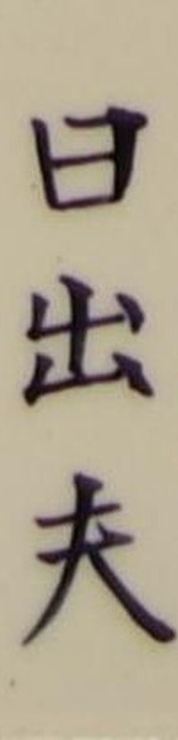日出夫
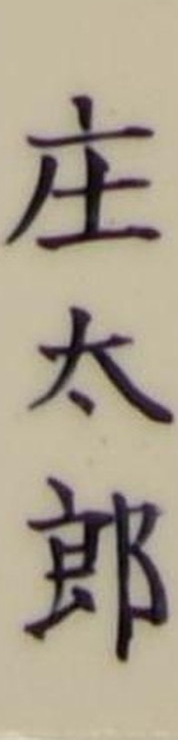庄太郎
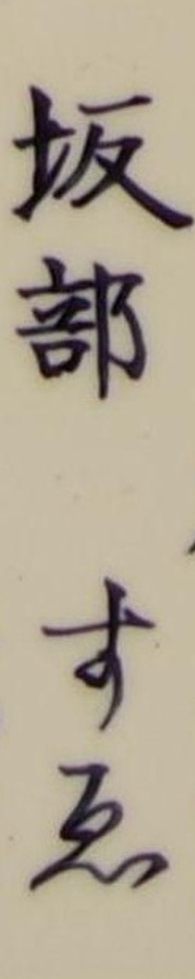坂部すゑ

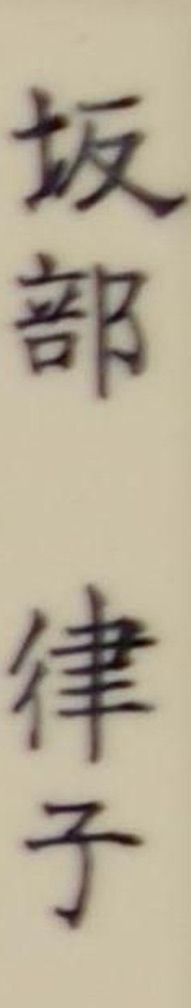坂部律子
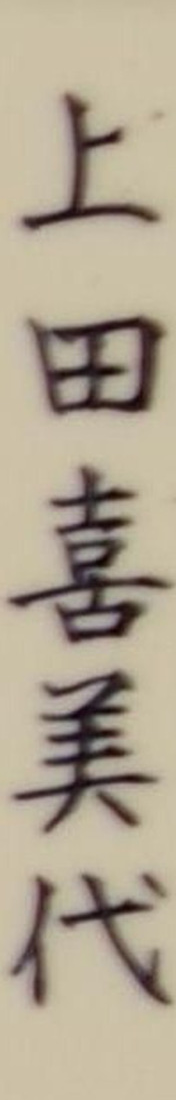上田喜美代
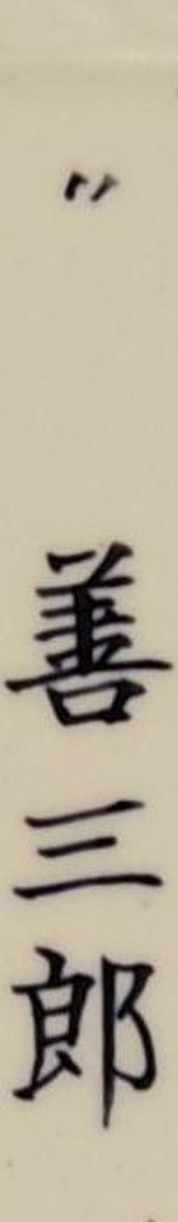善三郎
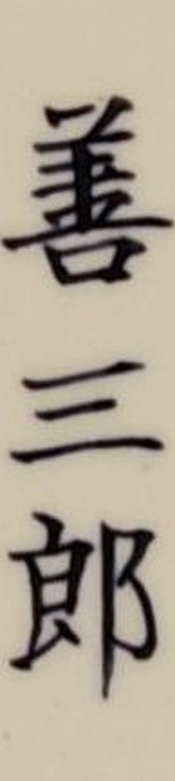善三郎
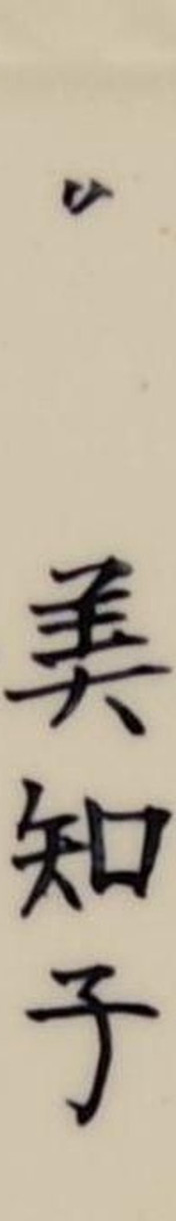美知子
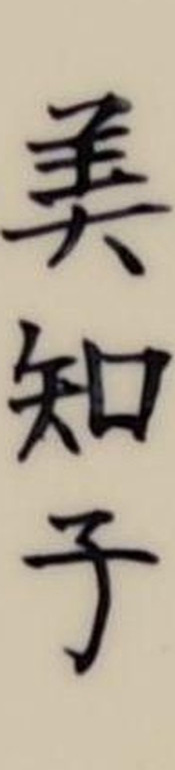美知子
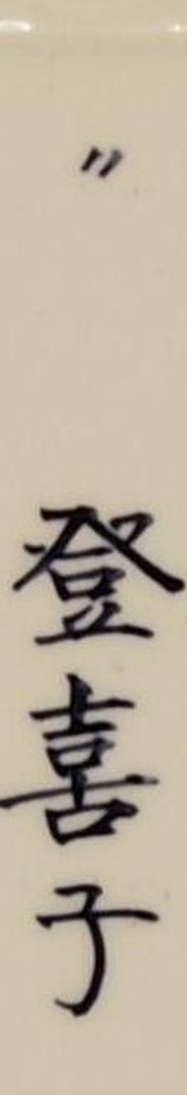登喜子
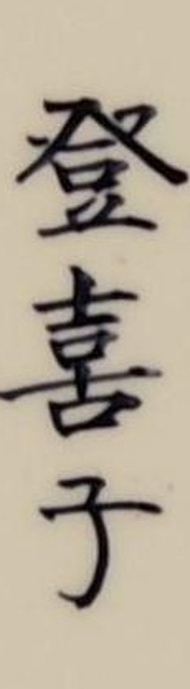登喜子
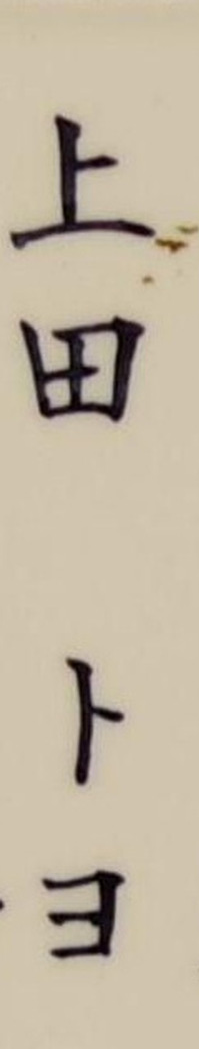上田トヨ
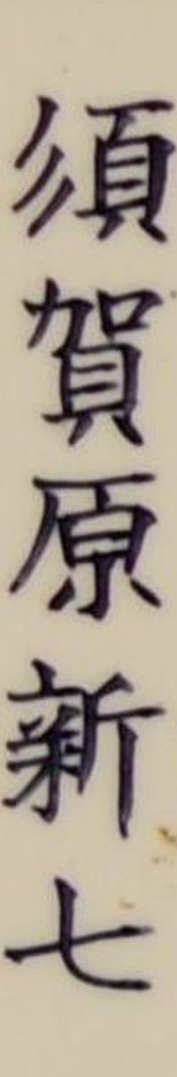須賀原新七
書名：A~D
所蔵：koyasan kongobuji
